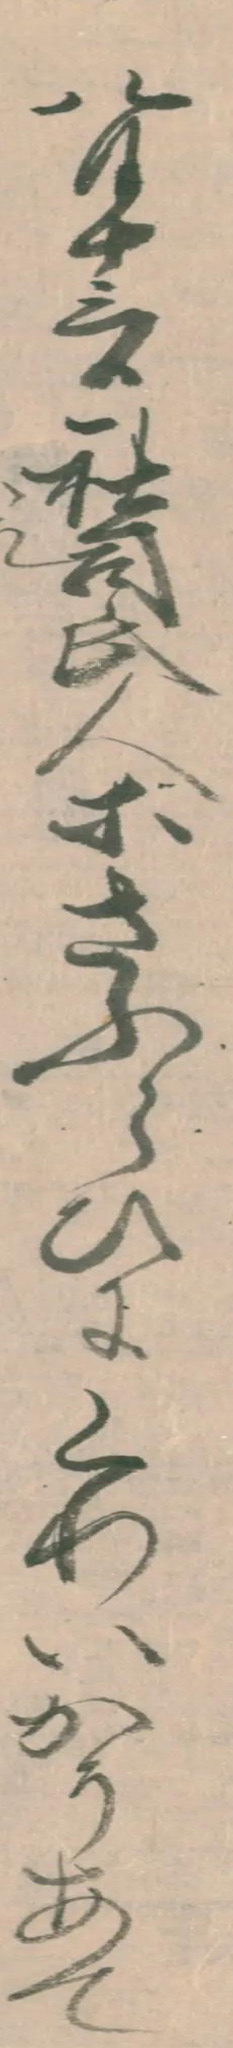一八月十三日社司氏人等さふらひにくわいかうあて
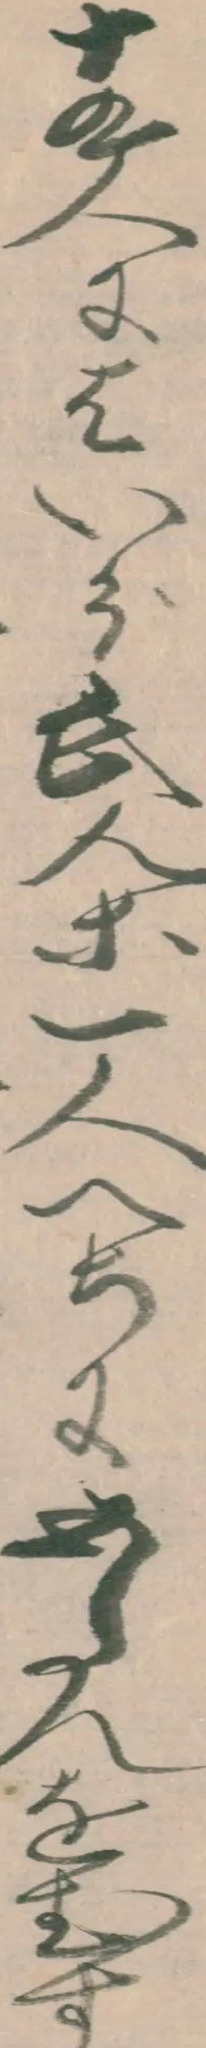十九人にはい分氏人等一人へちに五たんをむす
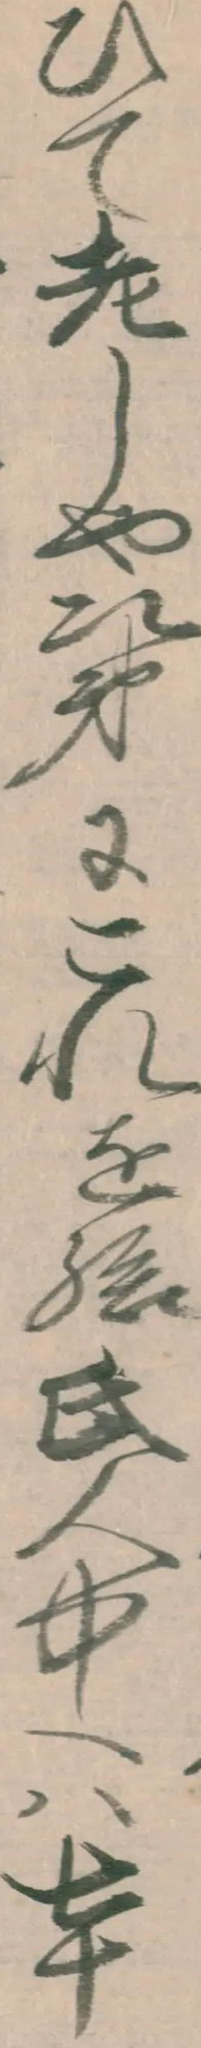ひて老しや次第にこれを給氏人中へは七十
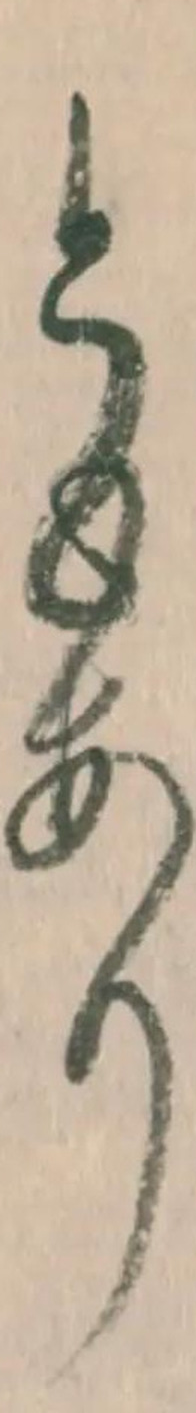ともあり
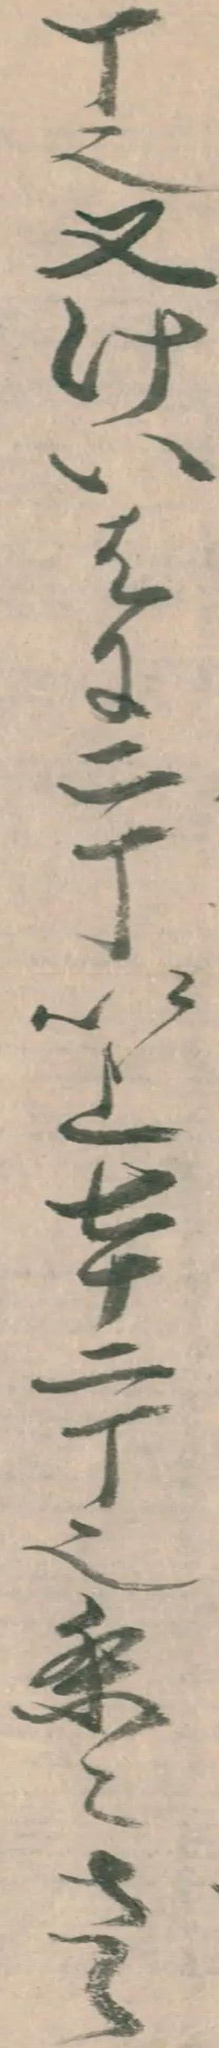丁也又けいはに二丁以上七十二丁也条々さた
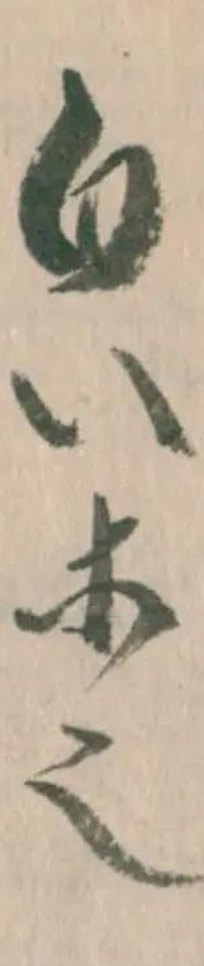白い等也
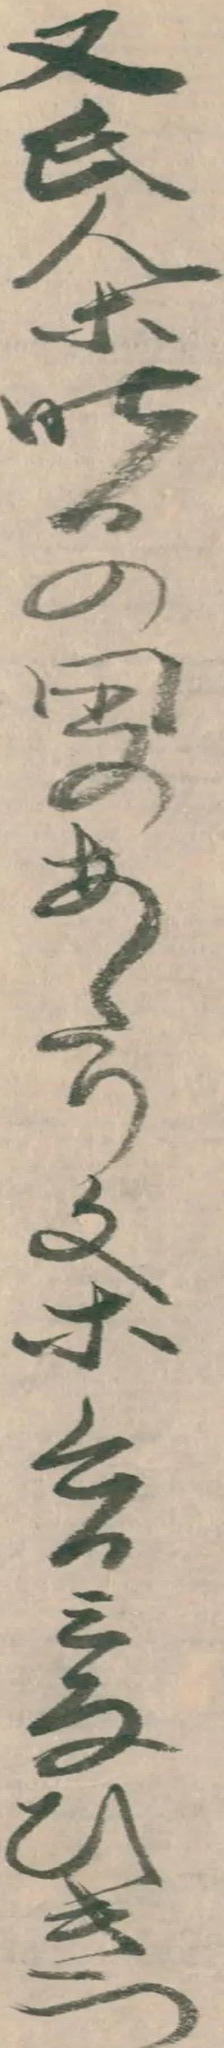又氏人等昨日の田のあたり反等今日三反ひきつ
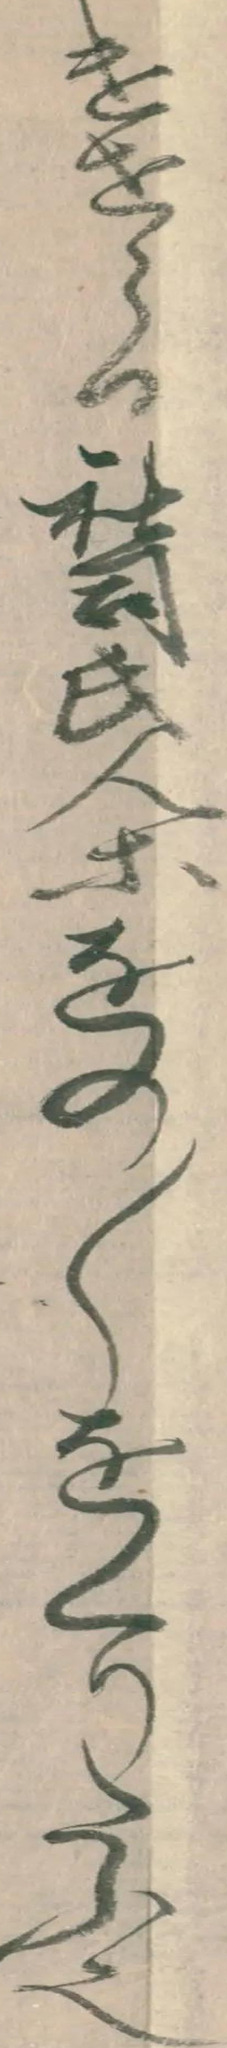けせらる社司氏人等をの〳〵をくりたふ也
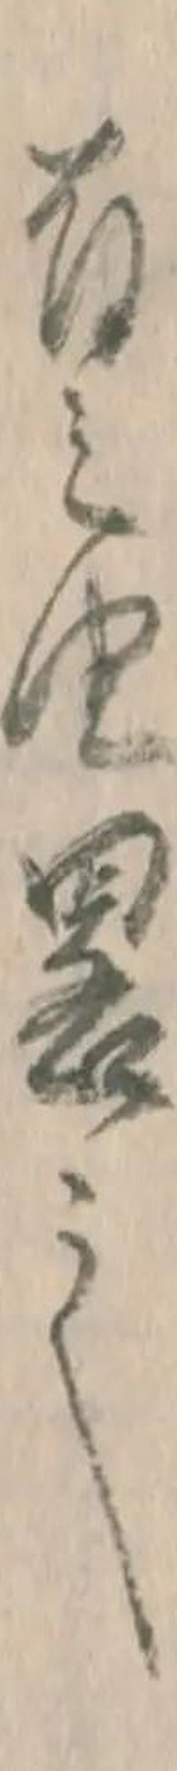有之由略也
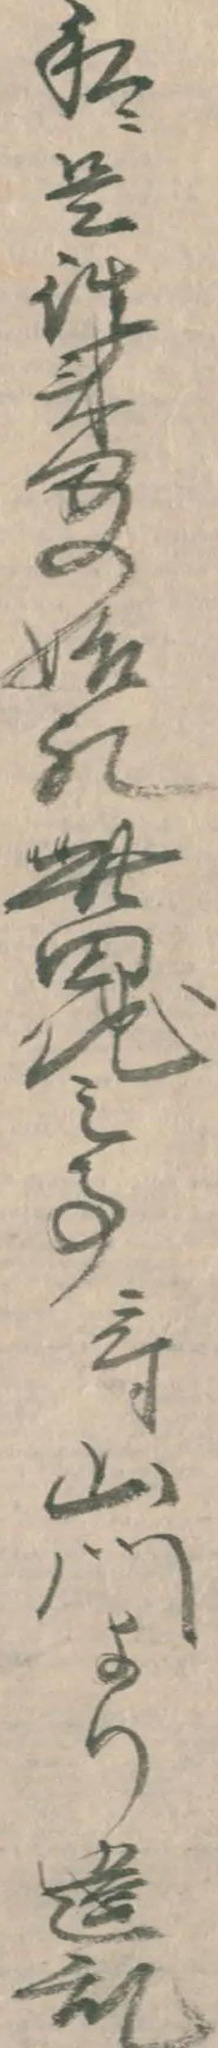私ニ是往来たの始歟此田地之事ニ付山門より違乱

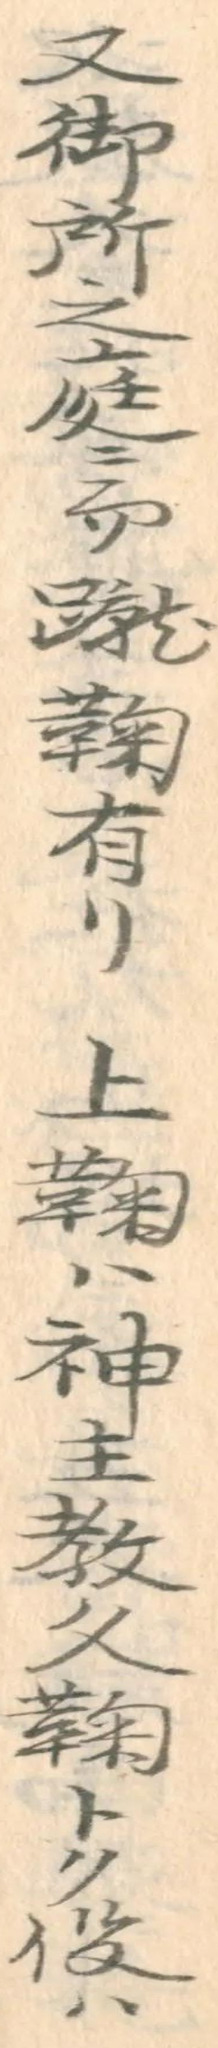又御所之庭ニ而蹴鞠有リ上鞠ハ神主教久鞠トク役ハ
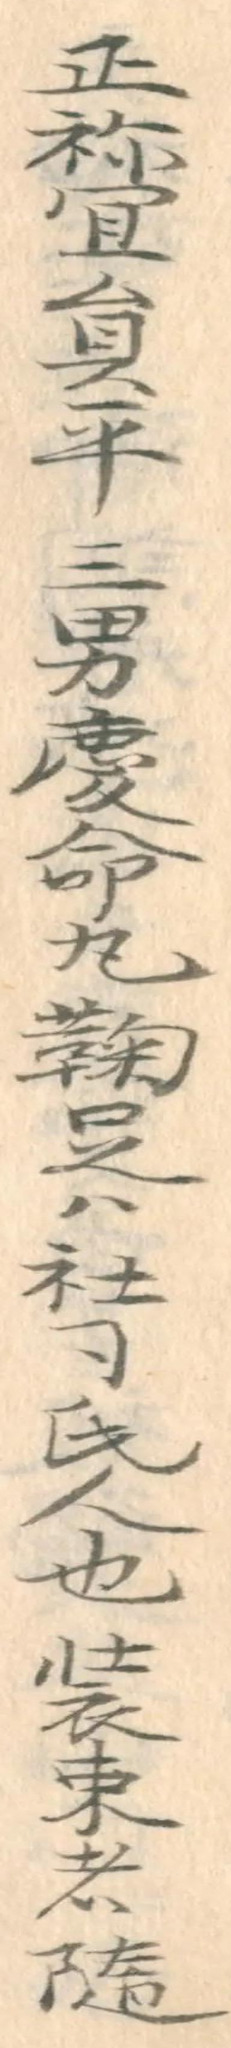正祢宜員平三男慶命丸鞠足ハ社司氏人也装束者随
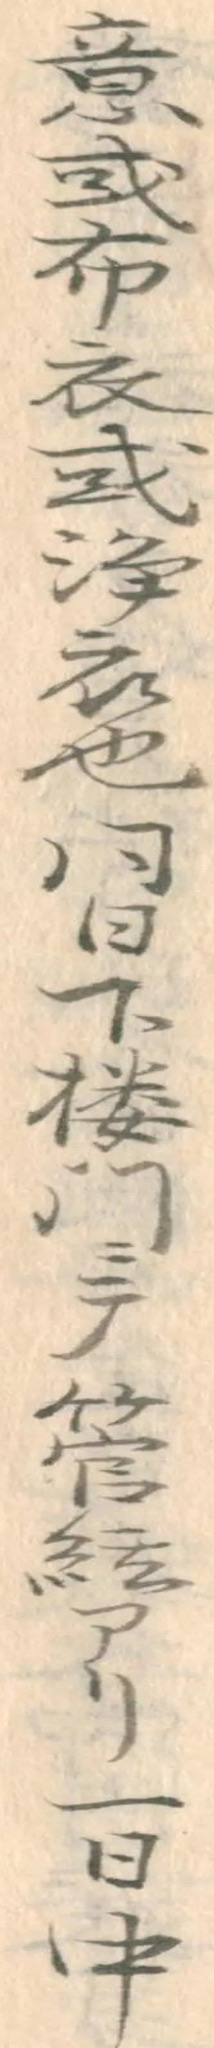意或布衣浄衣也同日下楼門ニテ管絃アリ一日中
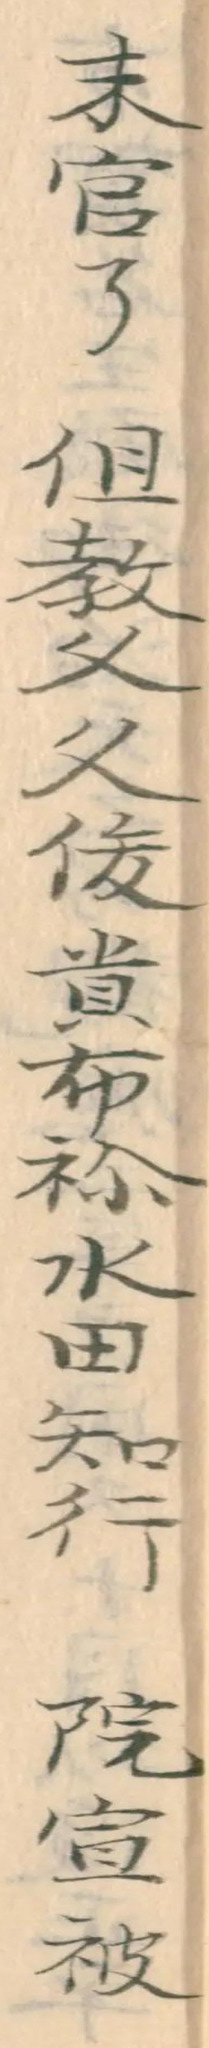未官了但教久久俊貴布祢水田知行院宣被
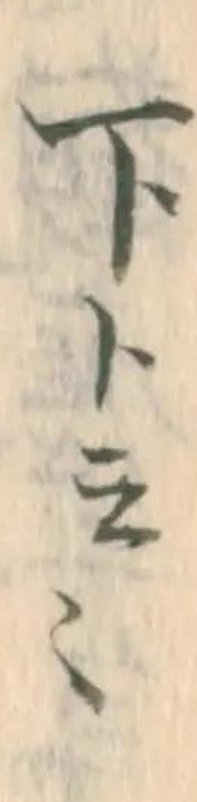下ト云々
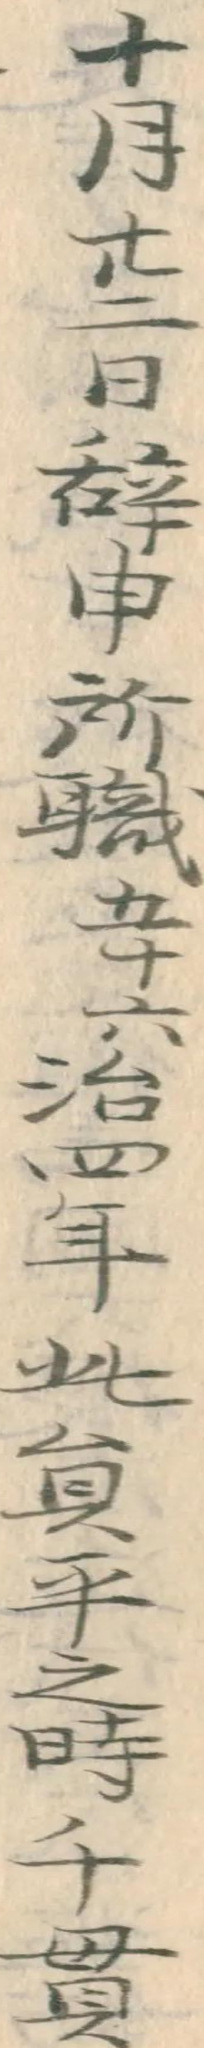十月廿二日辞申所職五十六治四年此員平之時千貫
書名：賀茂社記録. 第24冊
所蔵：国立国会図書館 National Diet Library, JAPAN
